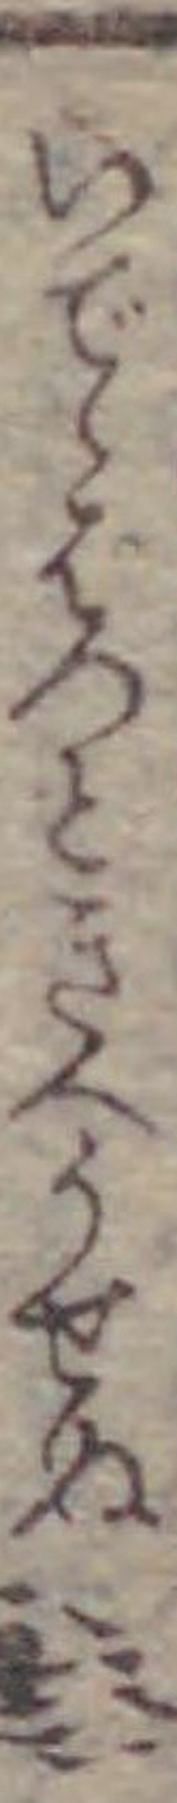いでゝはつときへうせぬ
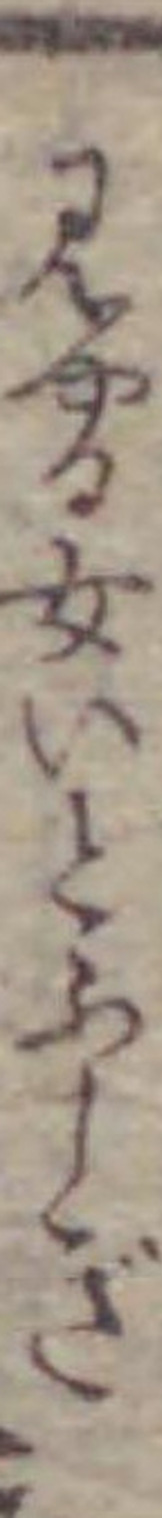見やる女いとふしぎ
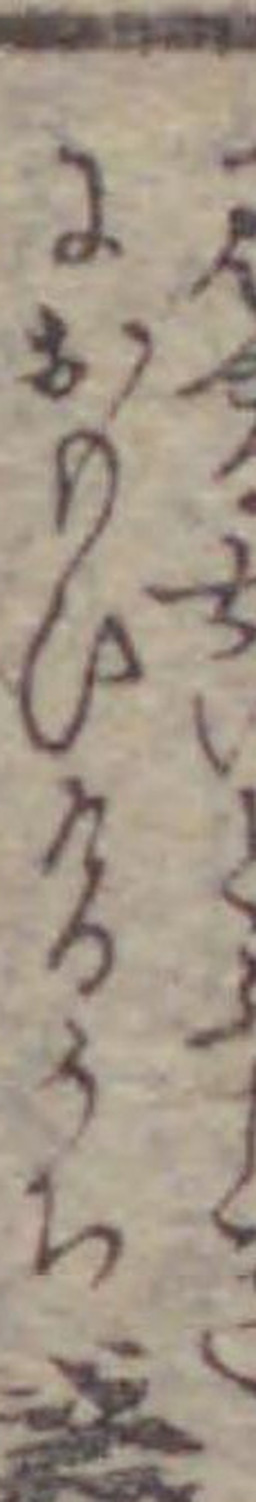におもひけるうち
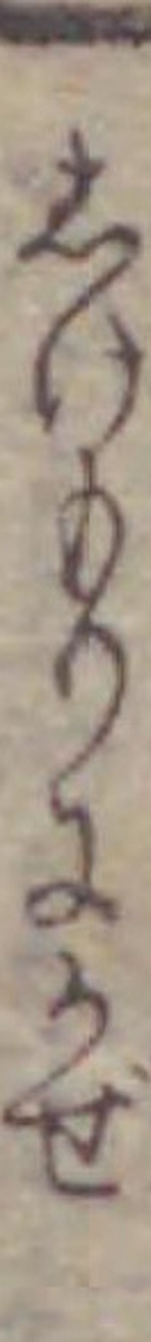しげもりにかぜ
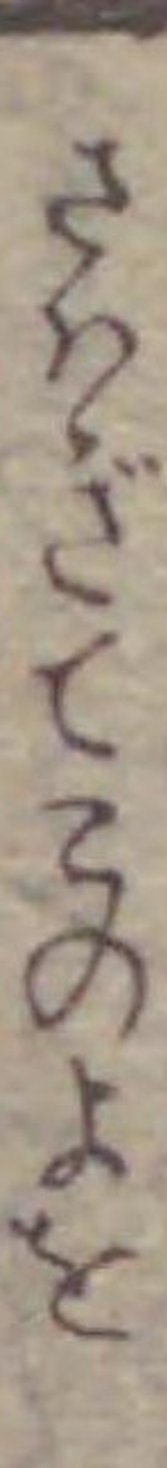さはぎてこのよを
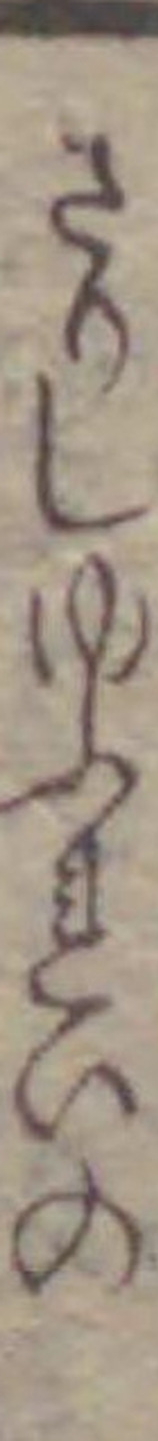さりしゆふれいの
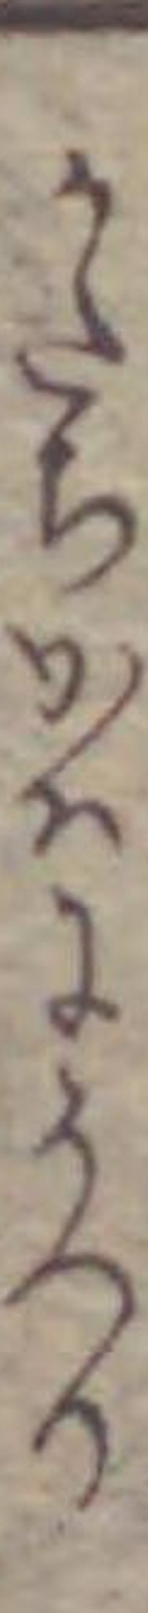かたちかはにうつり
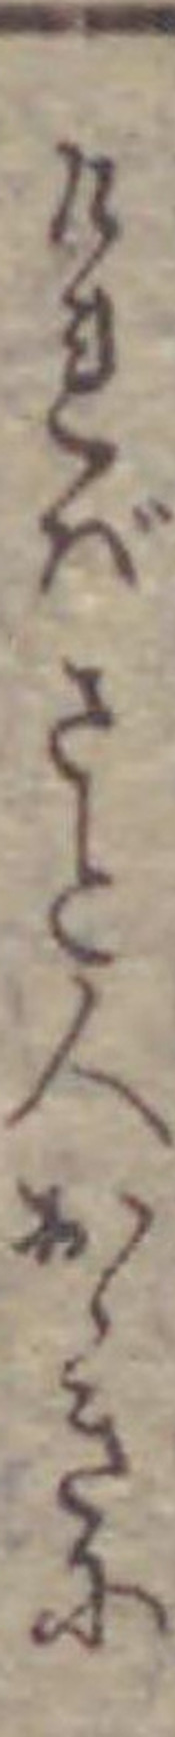ければさと人おゝきに
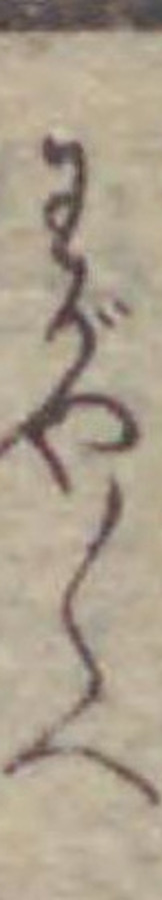わがや〳〵へ
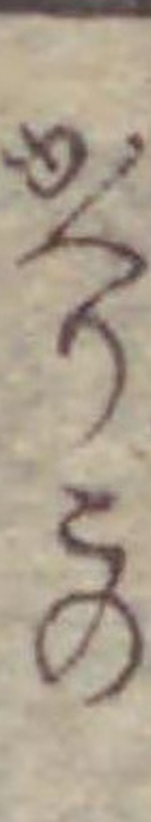かへりこの
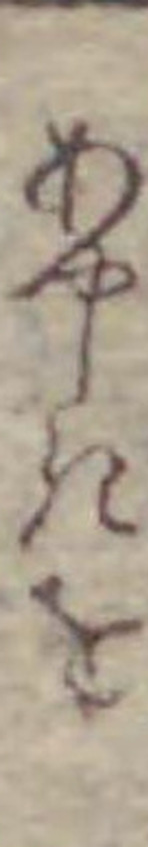あやしきを
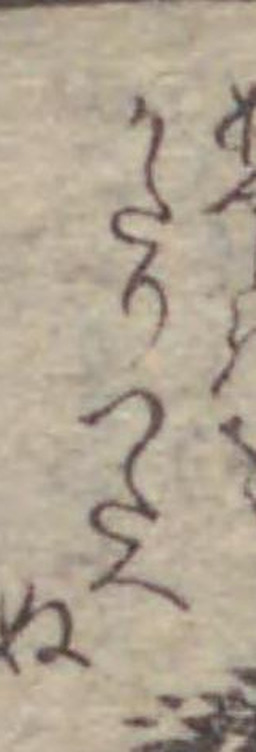かたりつたへ
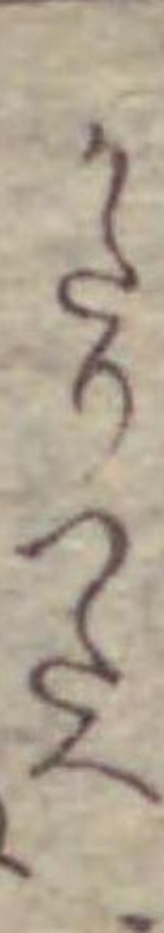かたりつたへ
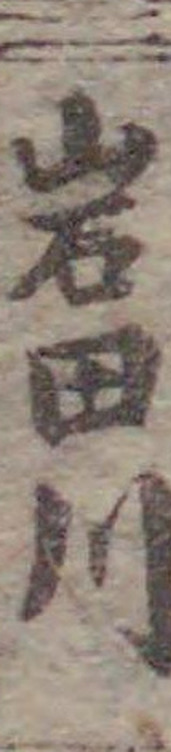岩田川

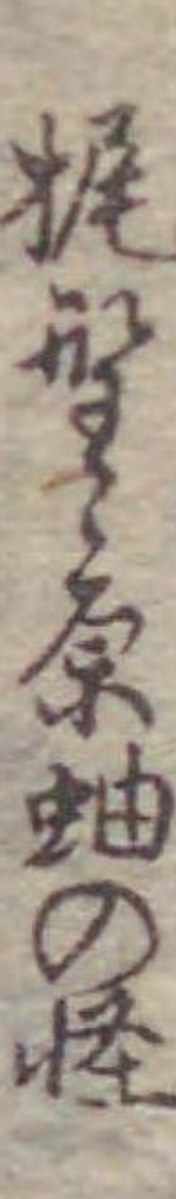梶野之原蚰の怪
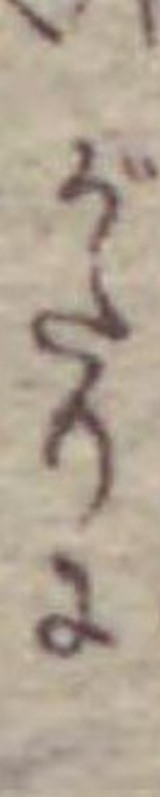がたりに
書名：武家物奇談 : 3巻
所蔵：国立国会図書館 National Diet Library, JAPAN
